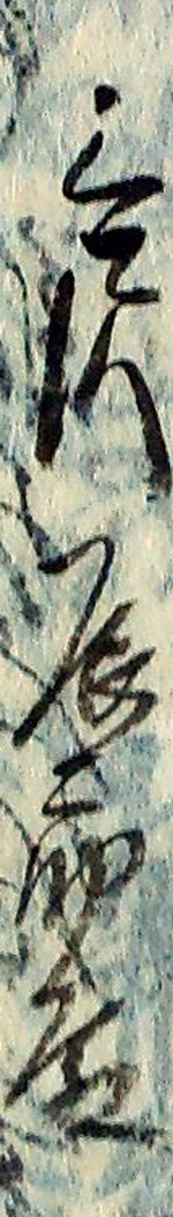三沢辰郎殿
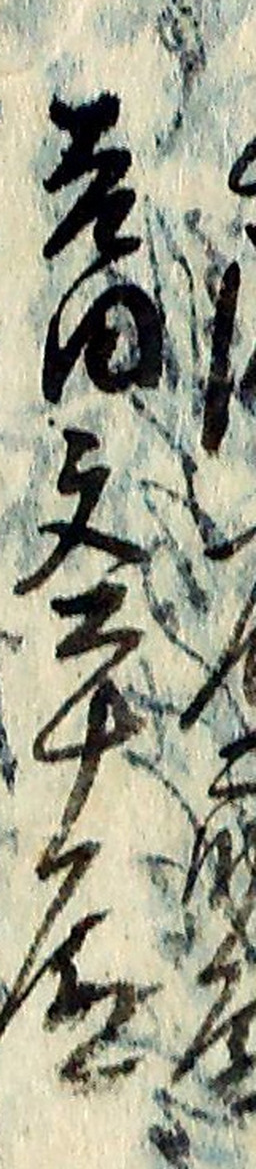吉田文平殿
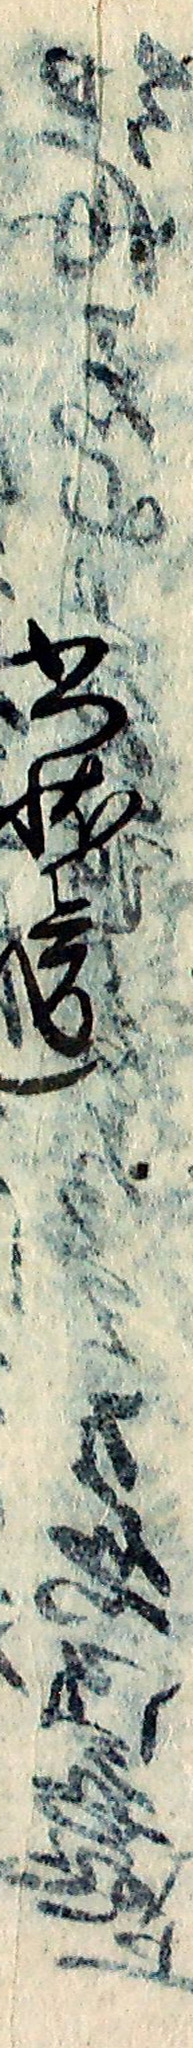書状送
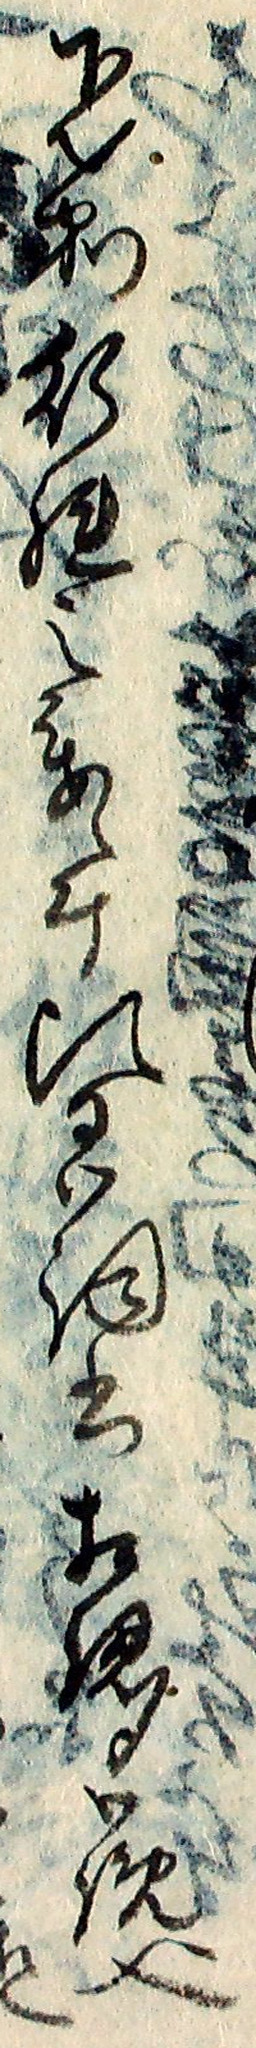下才判行縺之義に付頃日御伺書相認め御覧に入
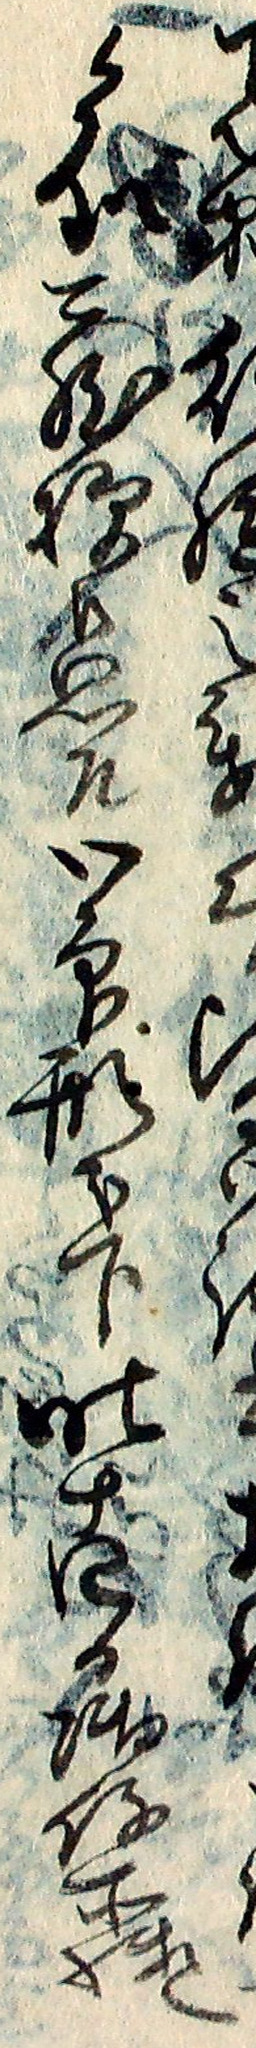候処可然様被思召御印形被下昨十四日御役所様へ

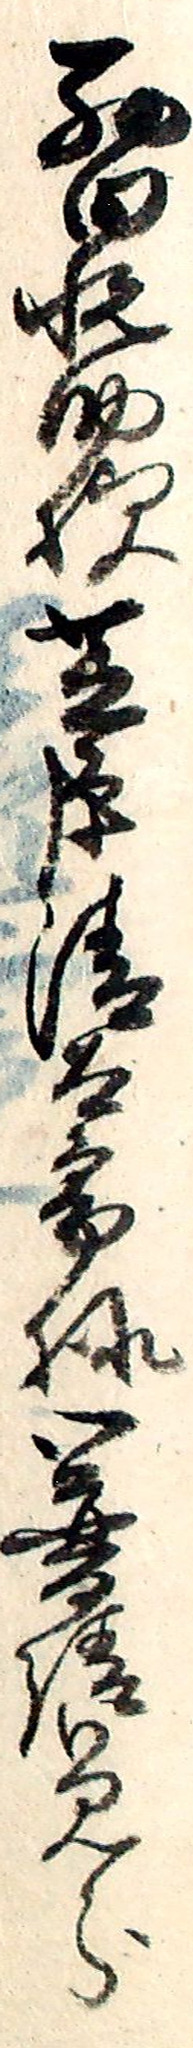西田悦助様芝原清太郎様御普請御見分
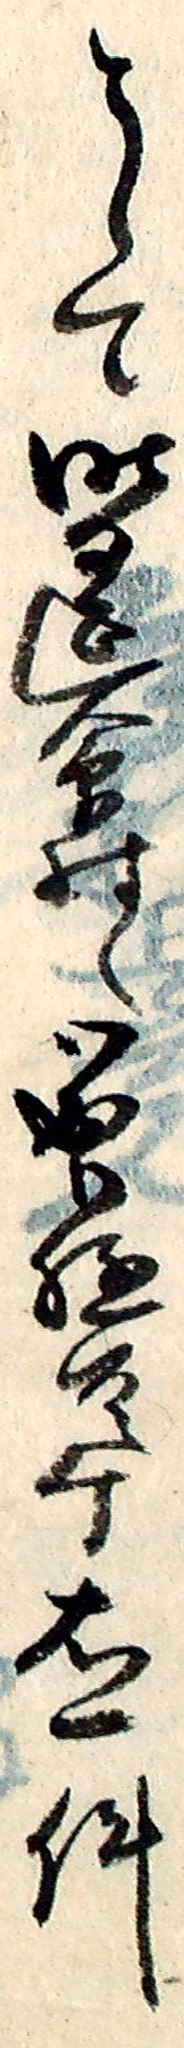として昨日延命村へ御出被遊候に付右一件
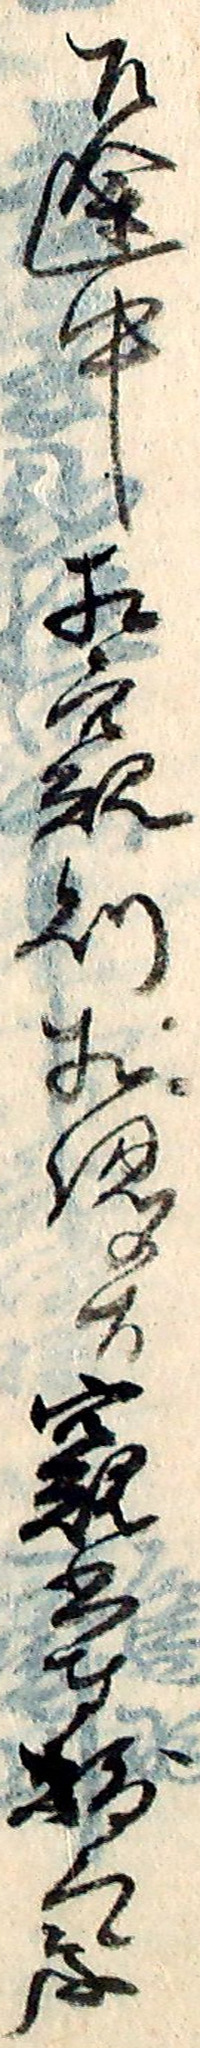乍途中相窺則相認め候窺書指上候処
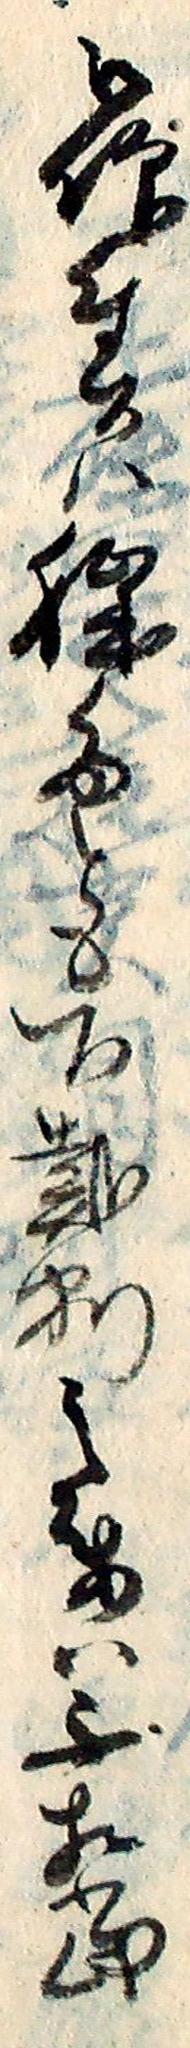被仰付候は穢多とも下裁判之義は不相当
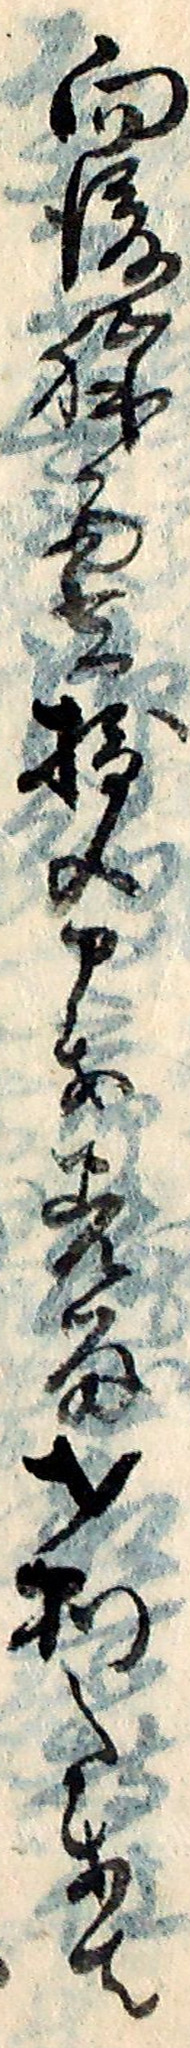向後穢多共指入申義差留才判之義は
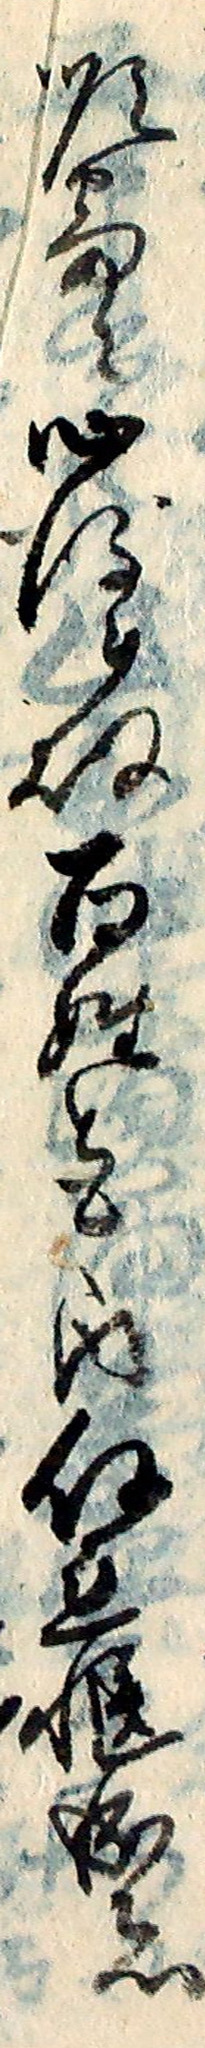順番之心得を以百姓とも之内何れ慥成者
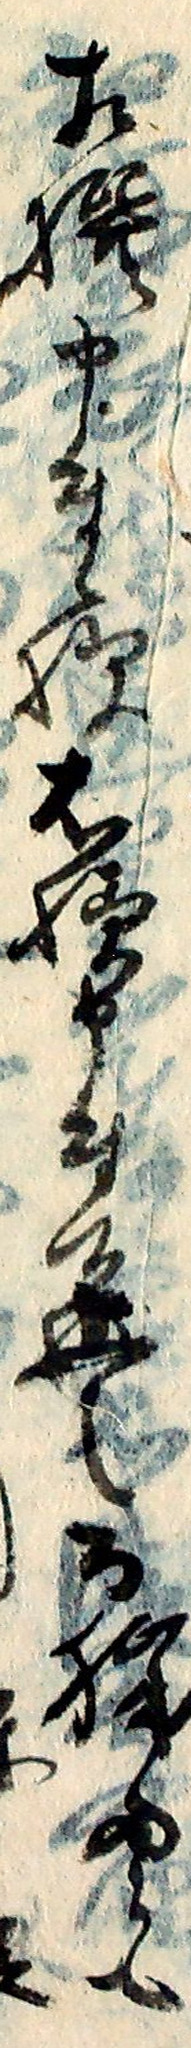相撰申付候様右様申付置候間穢多とも
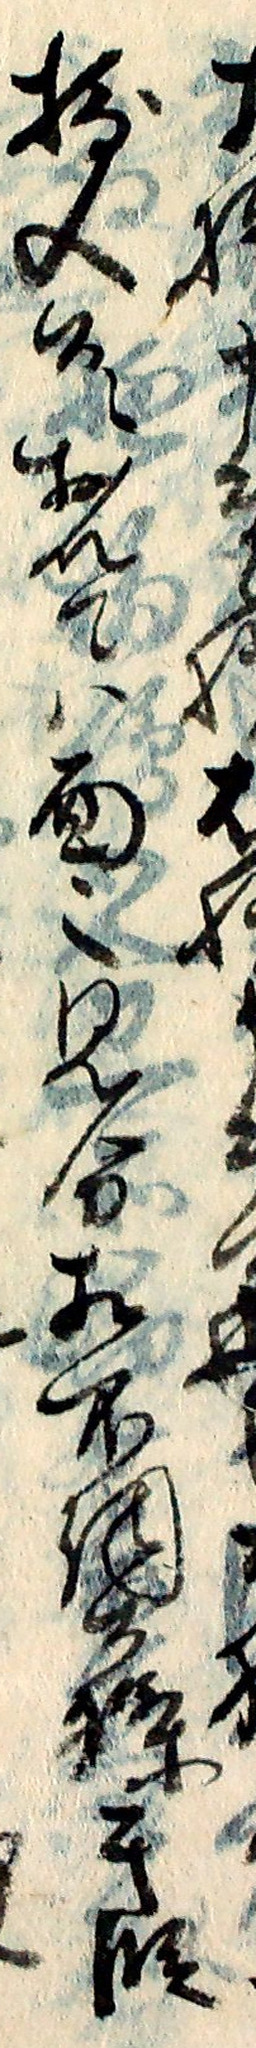指入候においては面々見分相不調候条其段
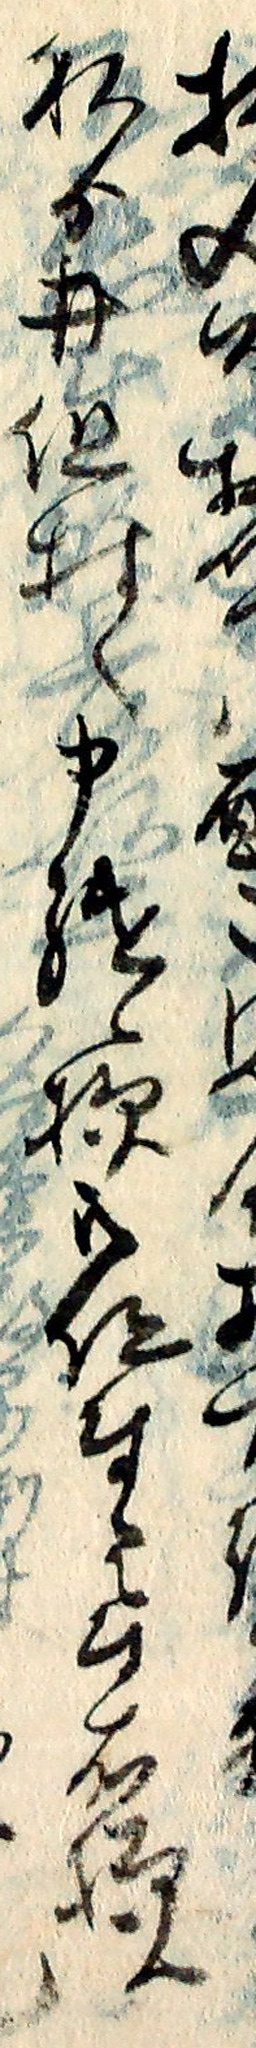私ゟ井組村へ申継候様被仰付候に付右様
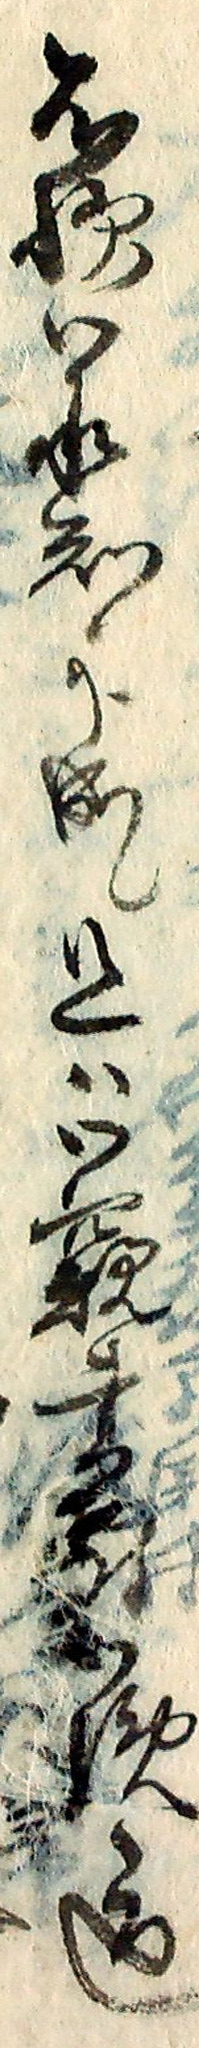右様御承知可被成候且は御窺書を御覧之通
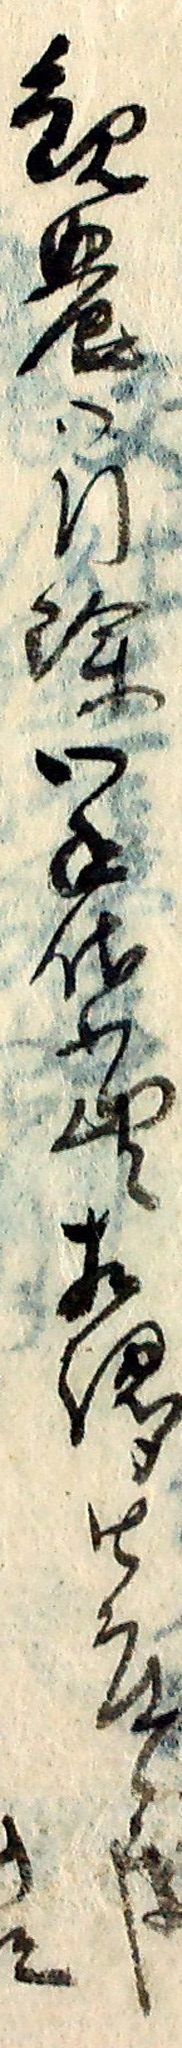勧農御引除御手代当に相認め御座候処
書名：諸御願書控(後藤氏壱番）
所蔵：鳴門教育大学 Naruto University of Education
